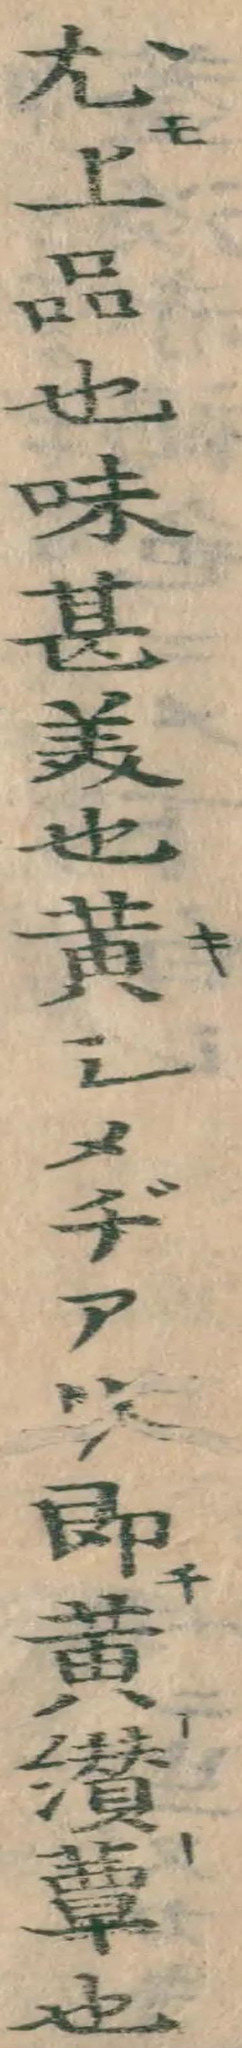尤上品也味甚美也黄シメヂアリ即黄濽蕈也
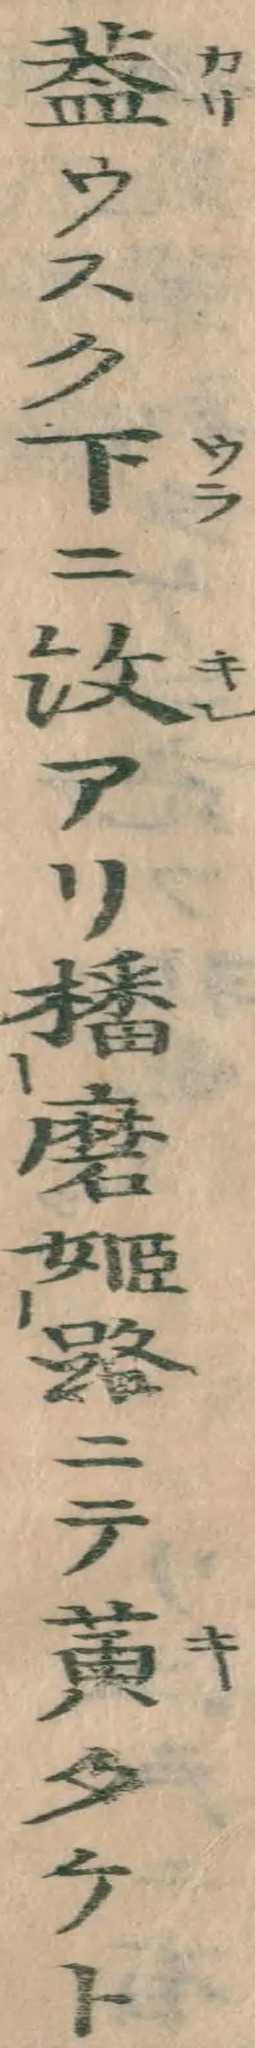葢ウスク下ニ紋アリ播磨姫路ニテ黄タケト
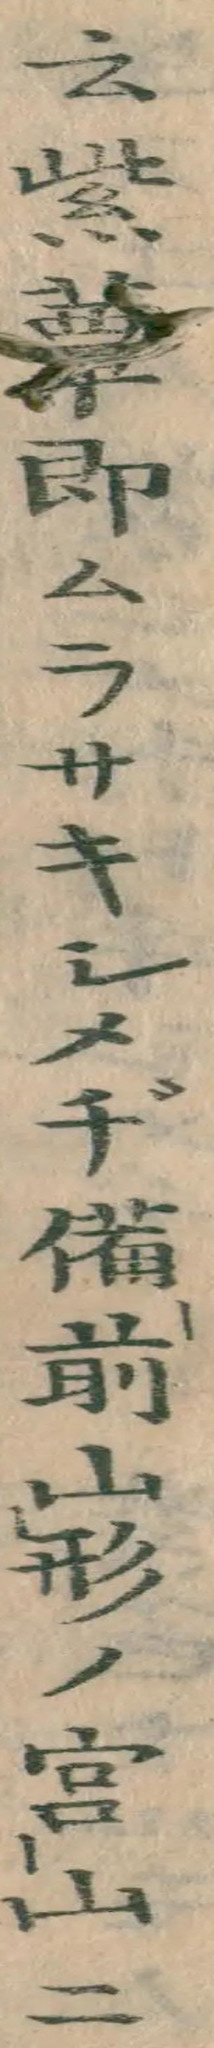云紫蕈即ムラサキシメヂ備前山形ノ宮山ニ

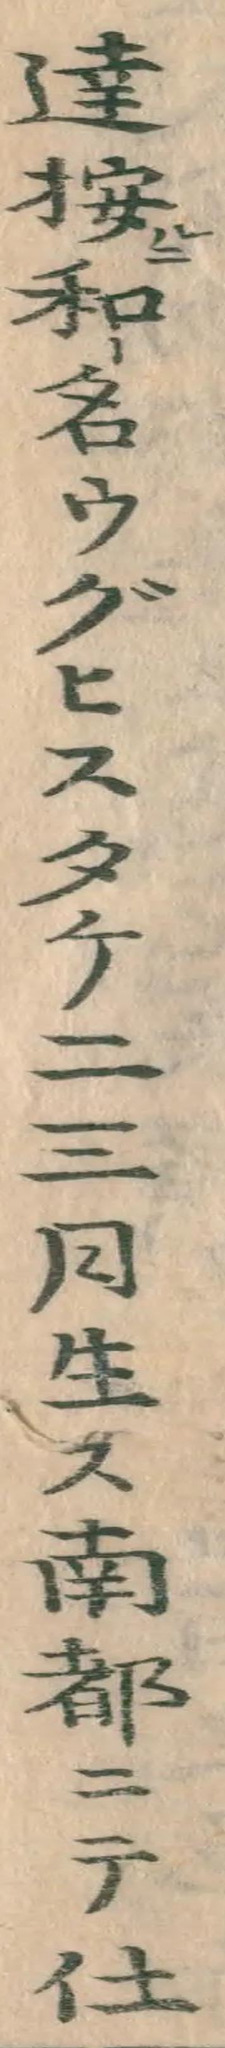達按和名ウグヒスタケ二三月生ス南都ニテ仕
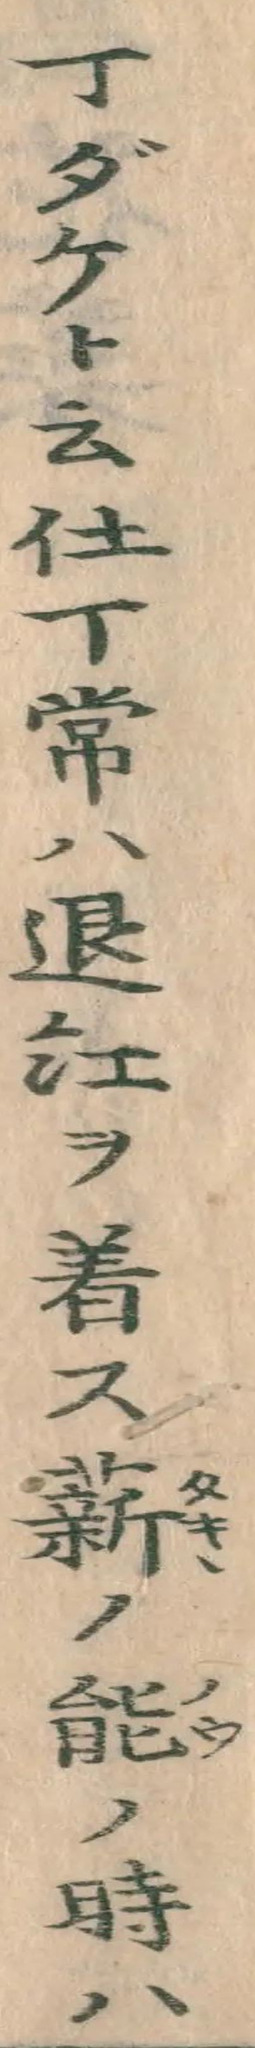丁ダケト云仕丁常ハ退紅ヲ着ス薪ノ能ノ時ハ
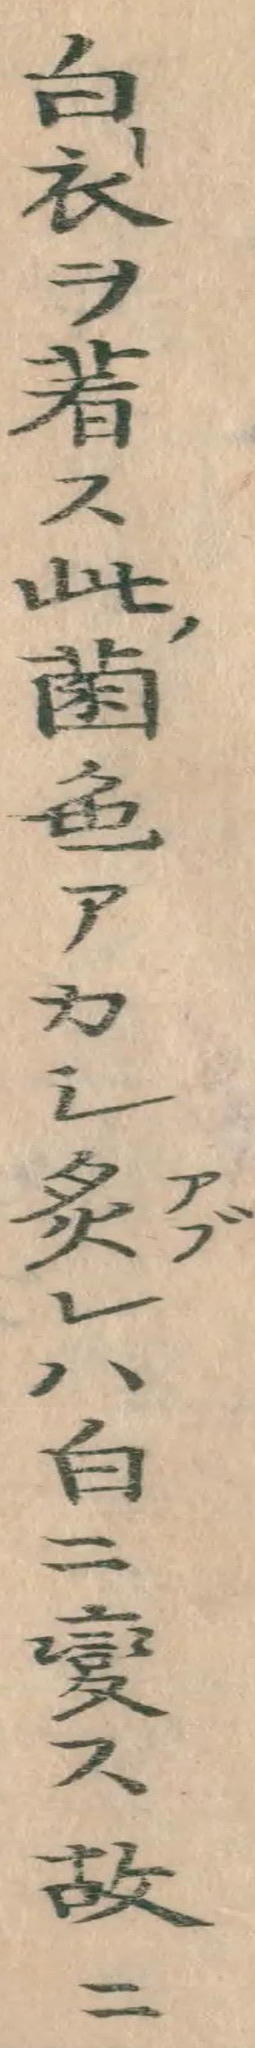白衣ヲ着ス此菌色アカシ炙レハ白ニ変ス故ニ
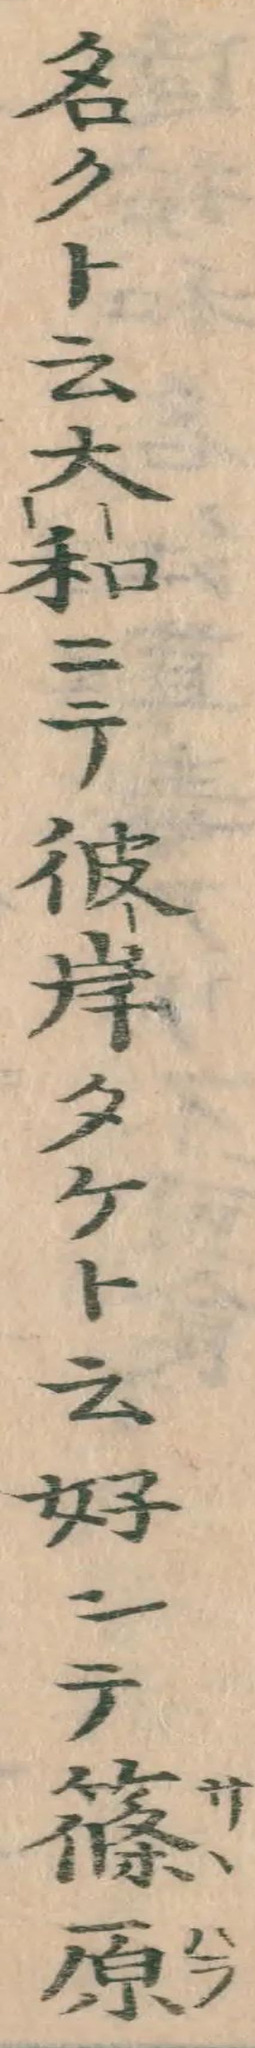名クト云大和ニテ彼岸タケト云好ンテ篠原
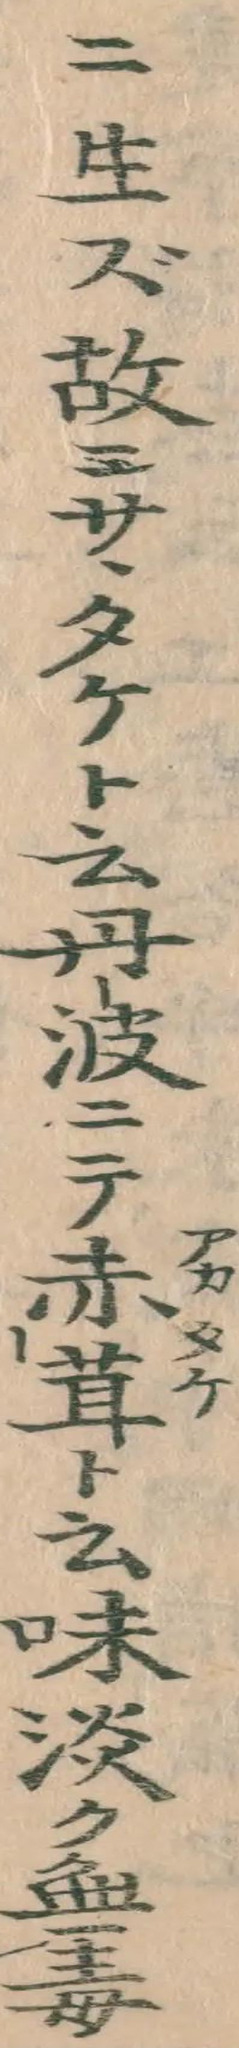ニ生ズ故ニサヽタケト云丹波ニテ赤茸ト云味淡ク無毒
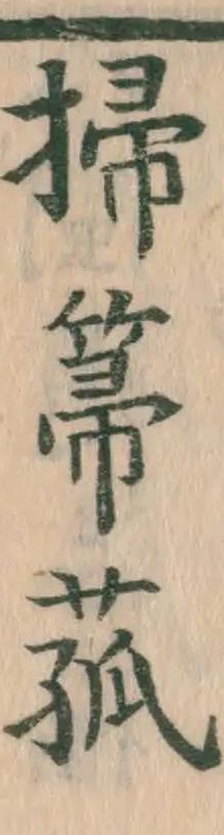掃箒菰
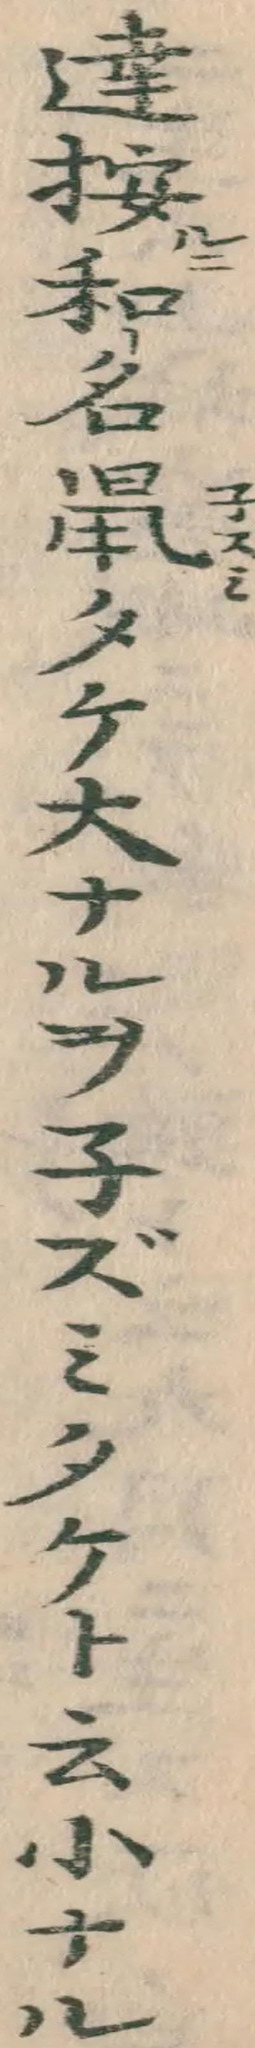達按和名鼠タケ大ナルヲネズミタケト云小ナル
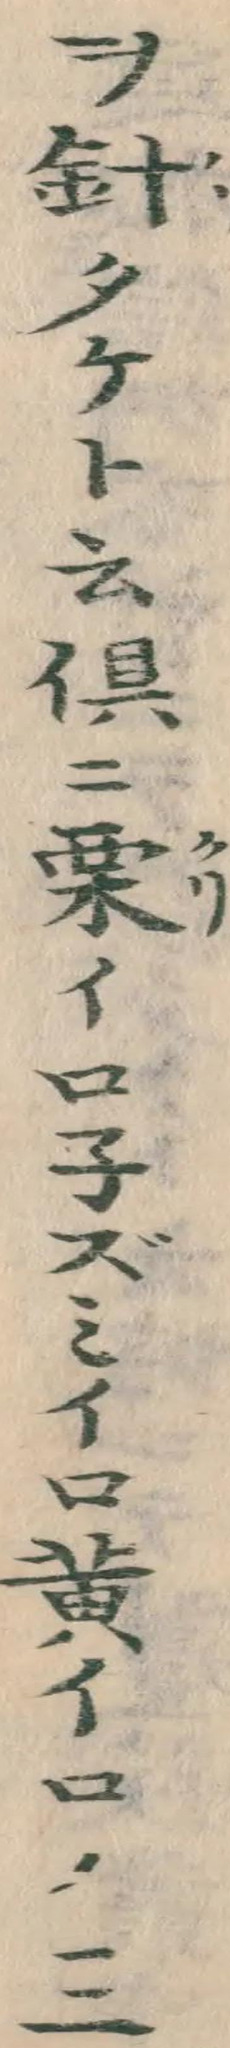ヲ針タケト云俱ニ栗イロネズミイロ黄イロノ三
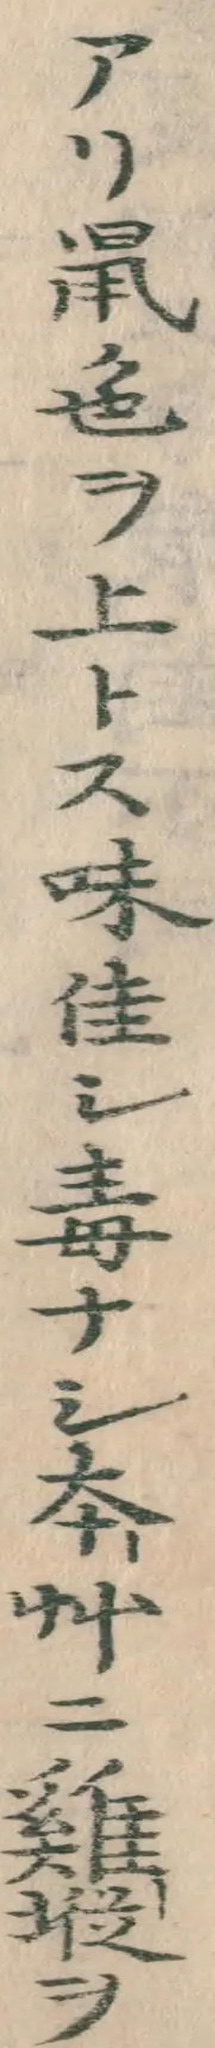アリ鼠色ヲ上トス味佳シ毒ナシ本草ニ鶏㙡ヲ
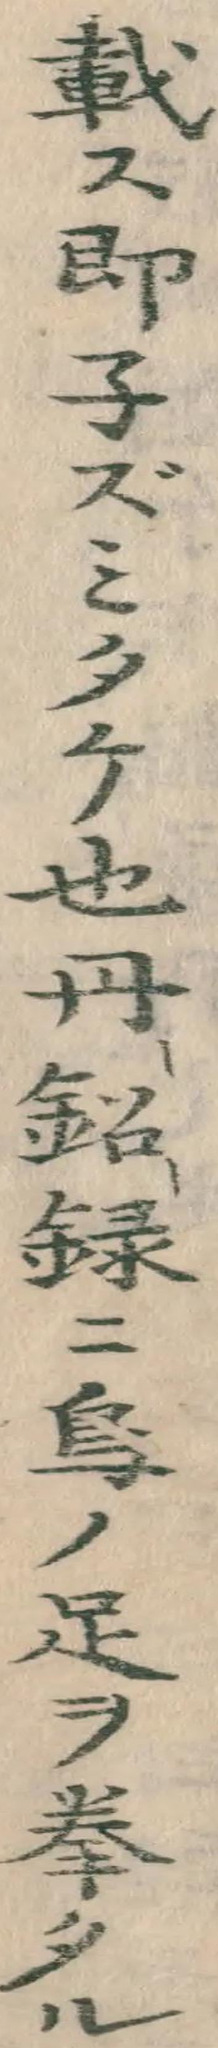載ス即ネズミタケ也丹鉛録ニ鳥ノ足ヲ挙タル
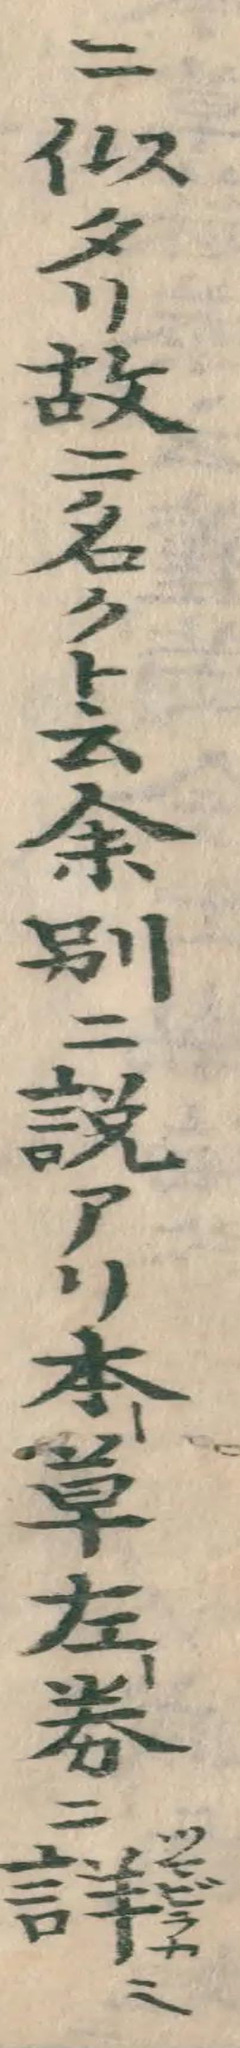ニ似タリ故ニ名クト云余別ニ説アリ本草左券ニ詳也

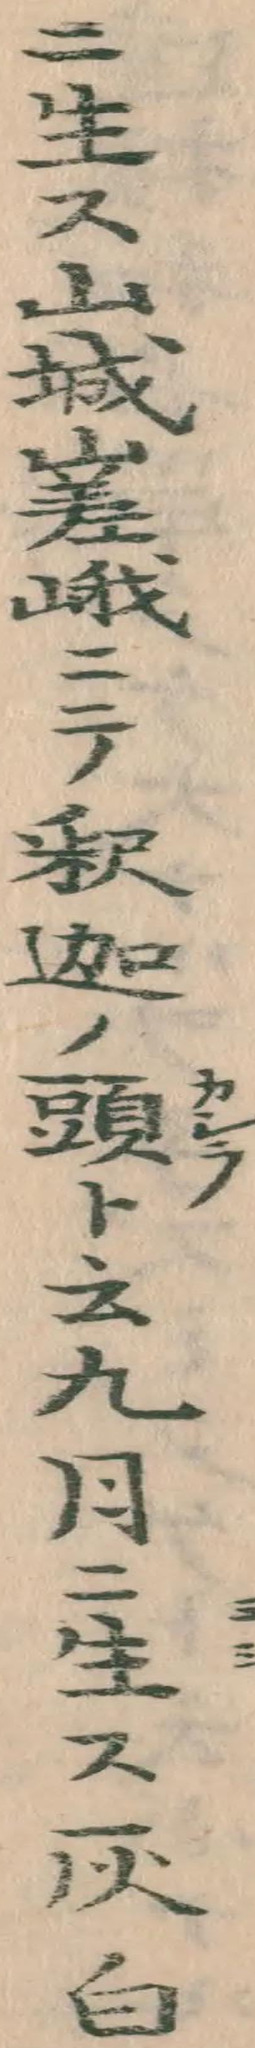ニ生ス山城嵯峨ニテ釈迦ノ頭ト云九月ニ生ス灰白
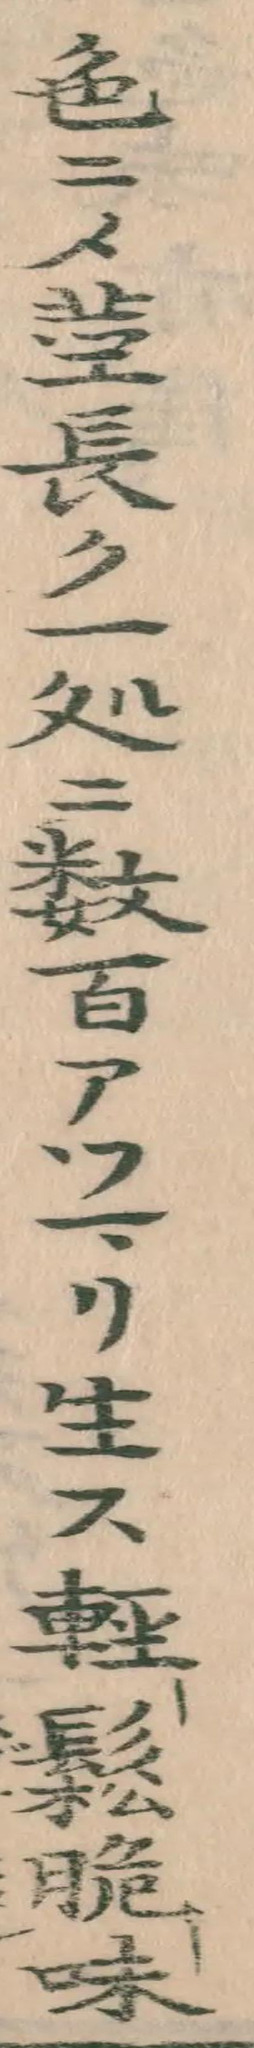色ニシテ茎長ク一処ニ数百アツマリ生ス軽鬆脆味
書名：怡顔斎菌品 2巻
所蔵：国立国会図書館 National Diet Library, JAPAN
